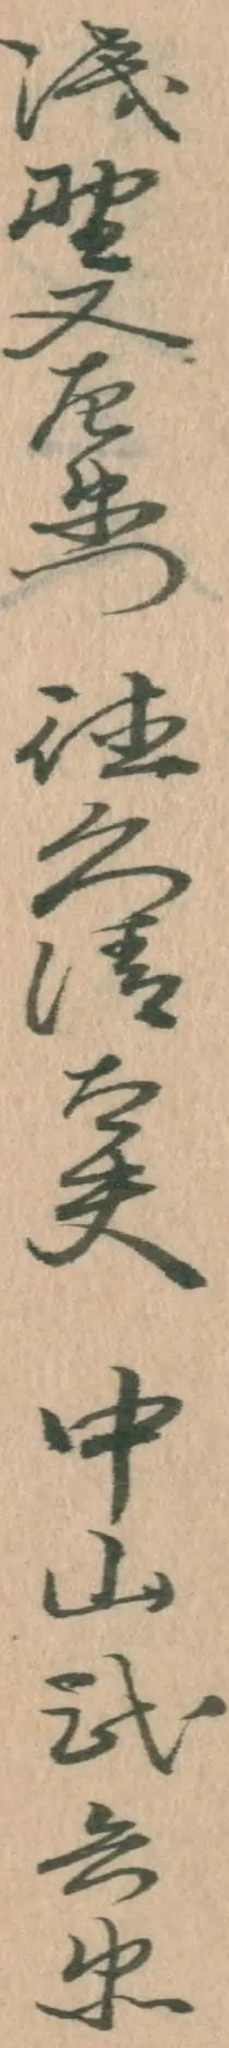浅野又左衛門徳久清太夫中山武兵衛
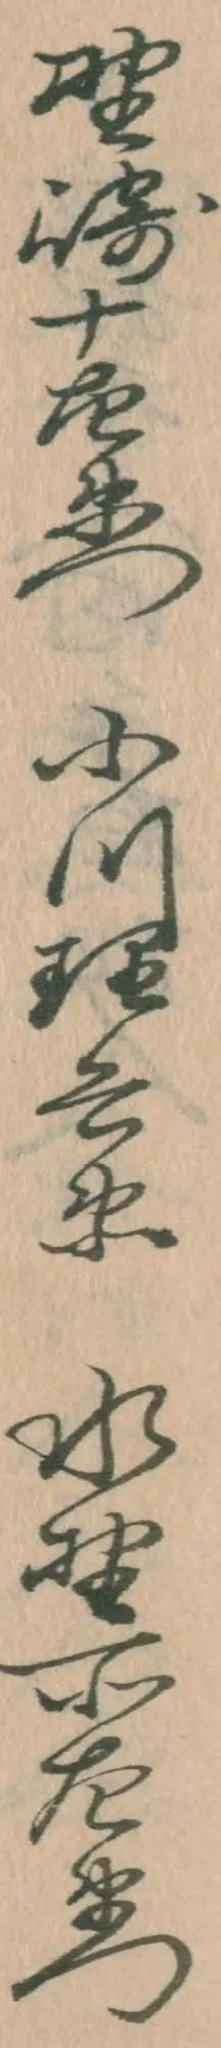野崎十左衛門小川理兵衛水野所左衛門
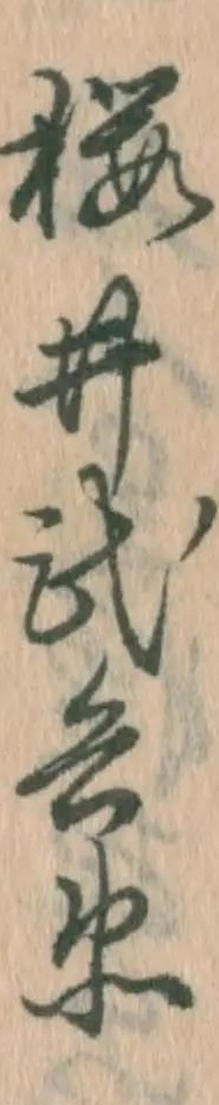桜井武兵衛
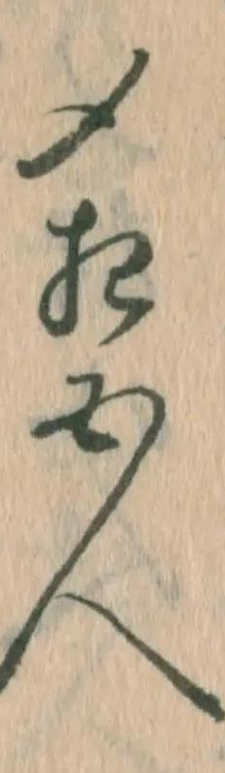〆拾五人
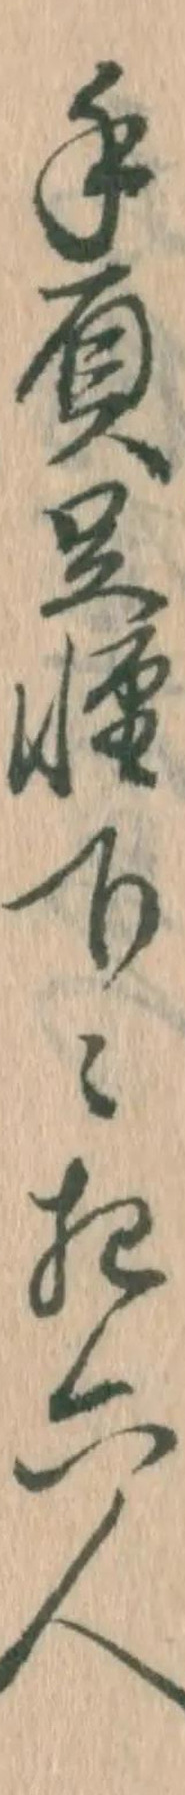手負足軽下々拾六人
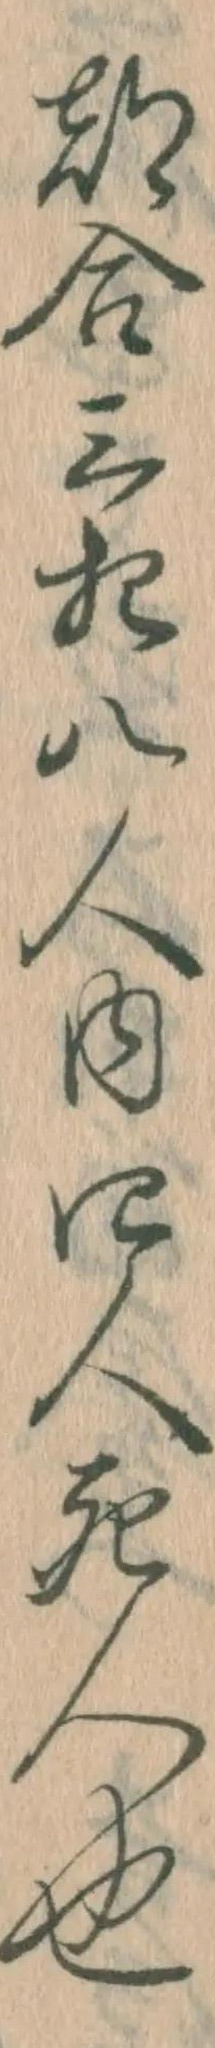都合三拾八人内四人死人也
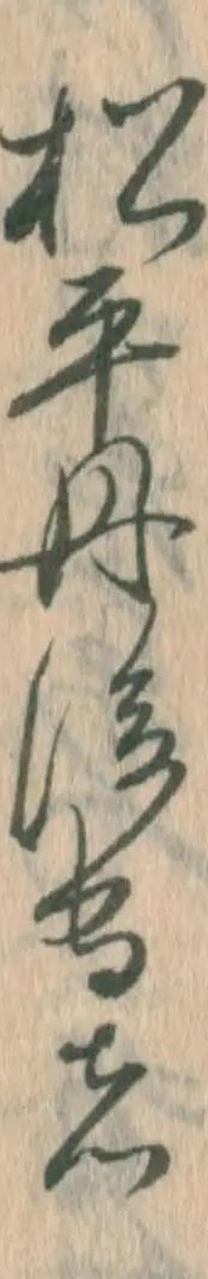松平丹後守者
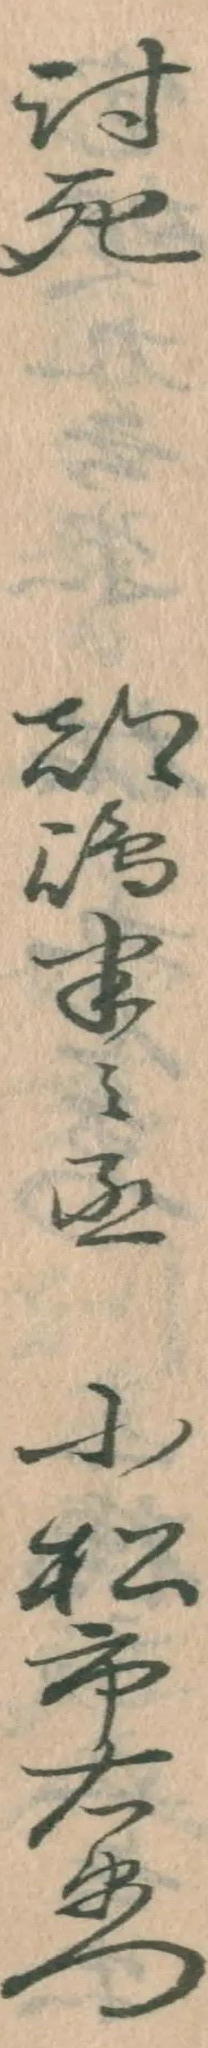討死都島半之丞小松市右衛門
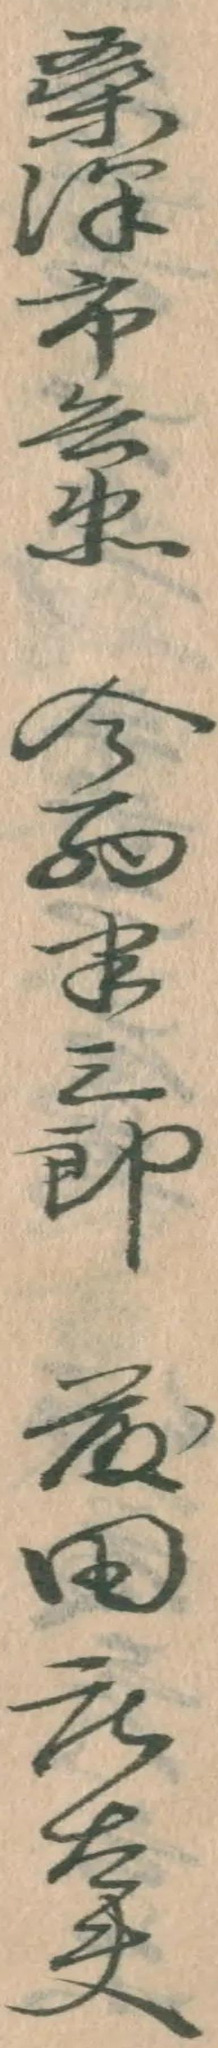桑沢市兵衛今西半三郎藤田庄太夫
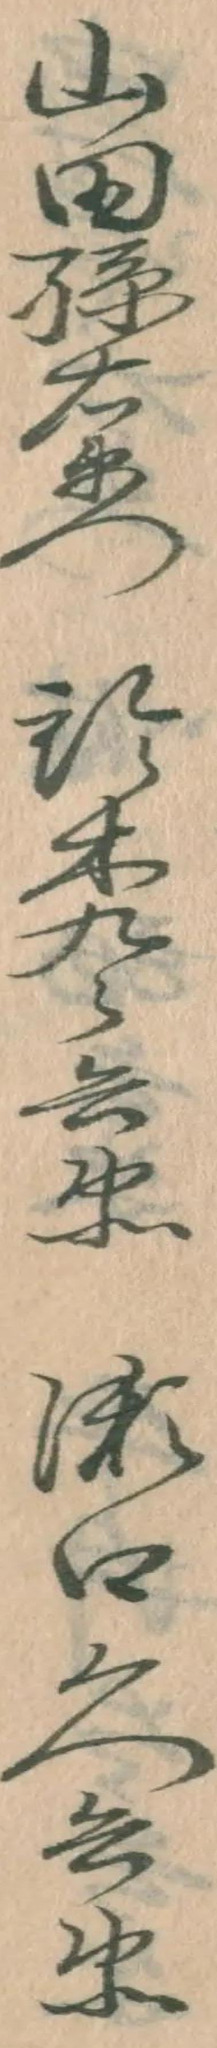山田孫右衛門鈴木九郎兵衛瀬口久兵衛
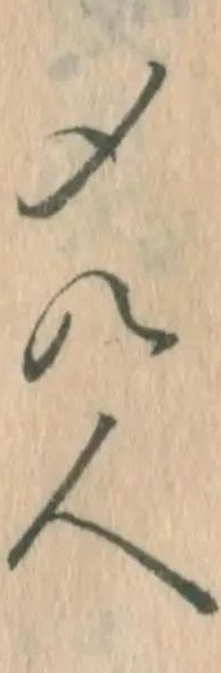〆八人

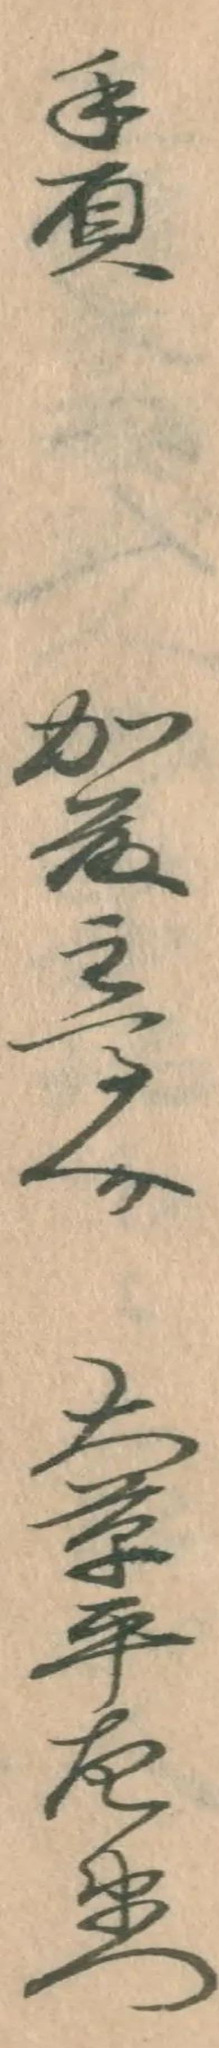手負加藤主馬介草平左衛門
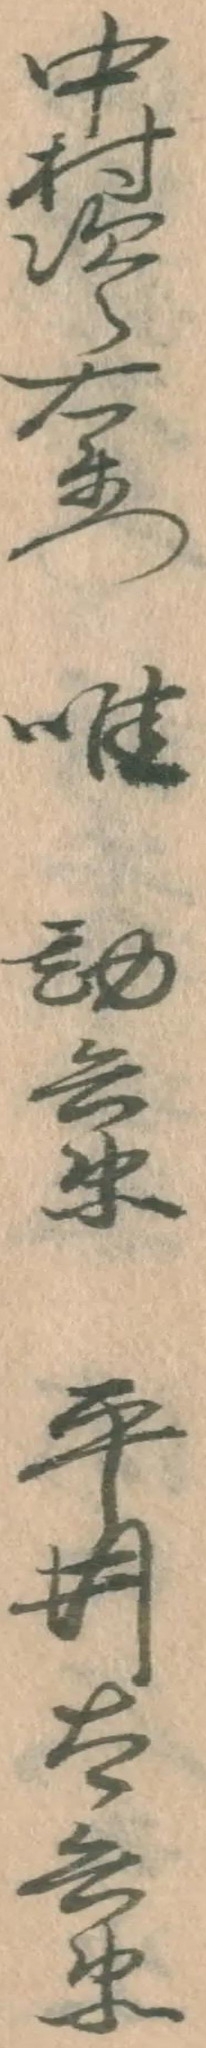中村次郎右衛門唯勘兵衛平井太兵衛
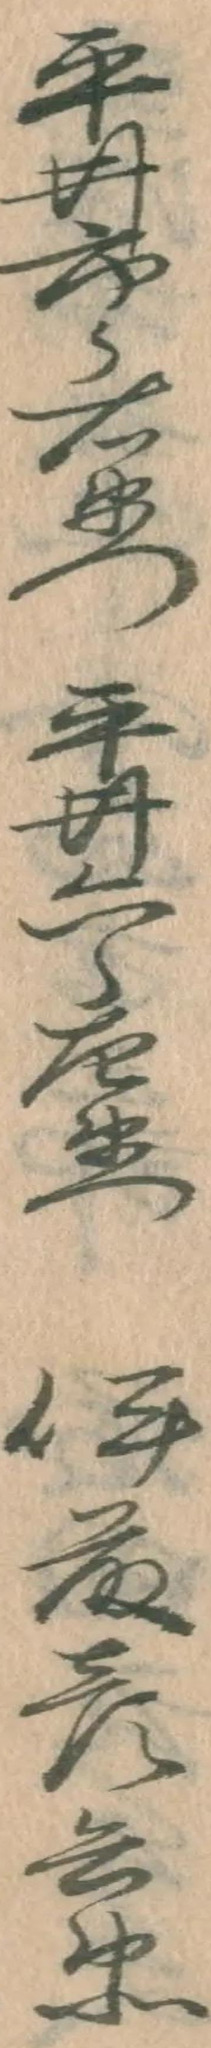平井市郎右衛門平井六郎左衛門伊藤彦兵衛
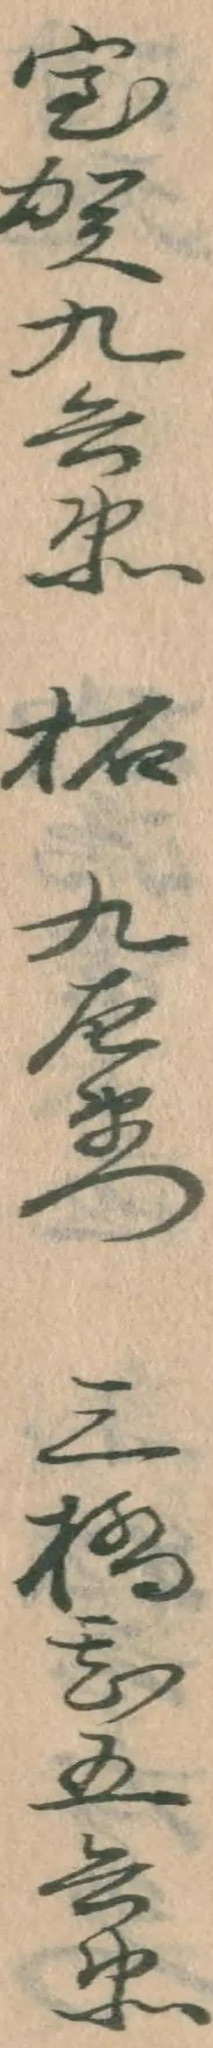宝賀九兵衛柘九左衛門三橋陣五兵衛
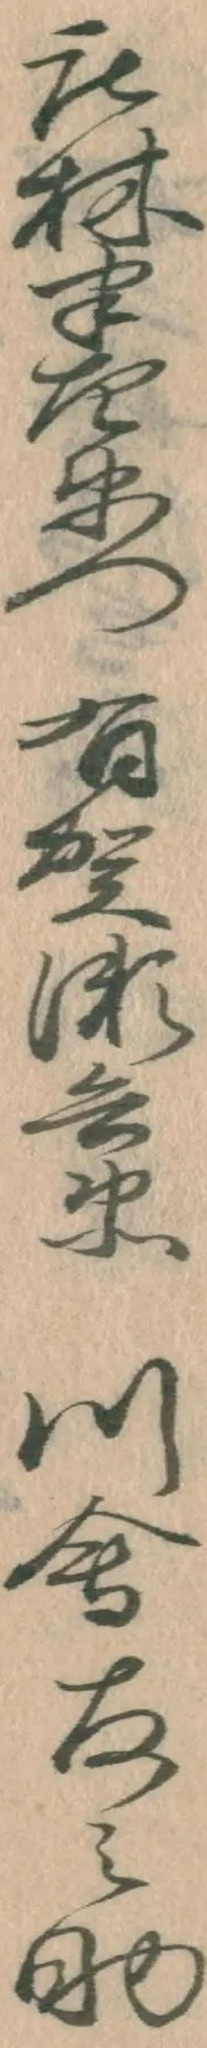庄林半左衛門有賀瀬兵衛川会友之助
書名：切支丹御退治記 49巻. [9]
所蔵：国立国会図書館 National Diet Library, JAPAN
